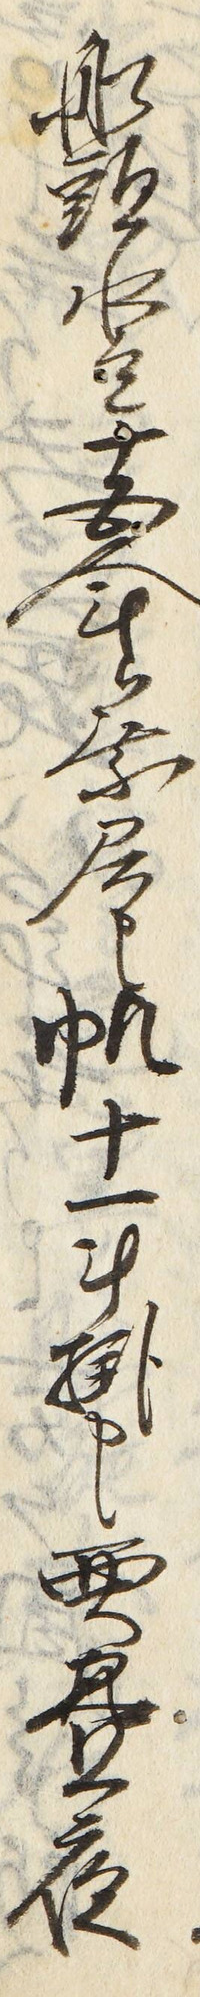船頭水主十五人計り乗居申候帆十一計掛申候西へ昼夜

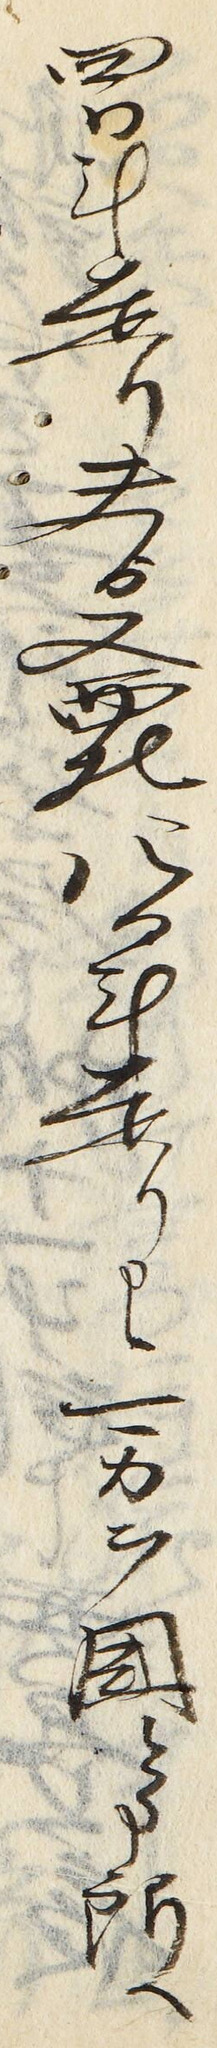四日計走り夫ゟ又西北へ八日計走り申候マカラ国と申所へ
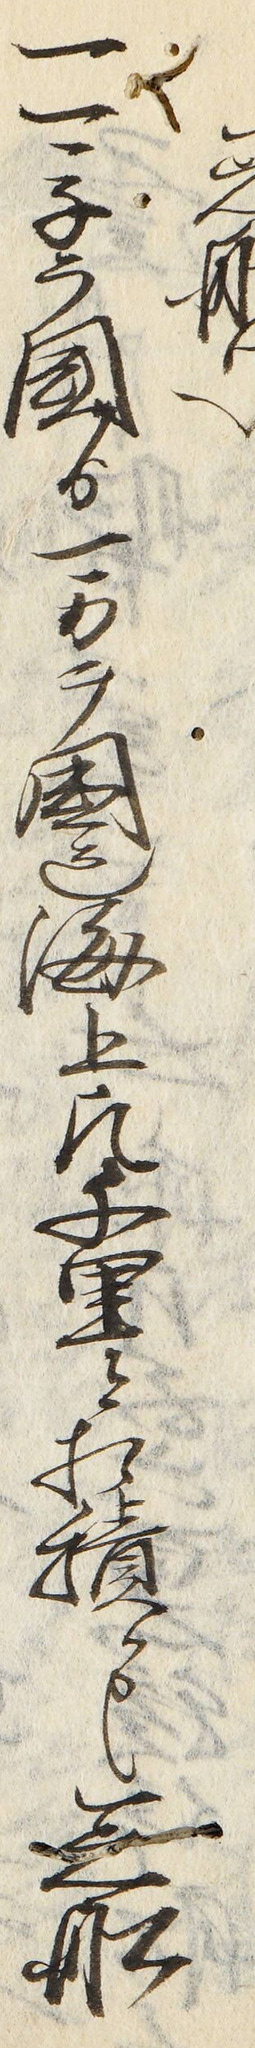一マネラ国ゟマカラ国迄海上凡千里を相積り申候着船
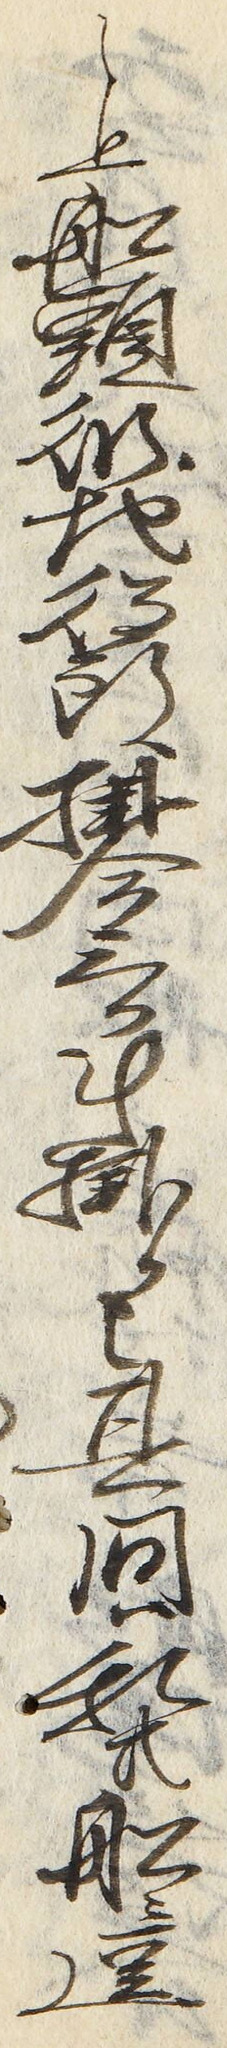之上船頭彼地役所へ掛合三日計掛り申候其間は私共船ニ逗
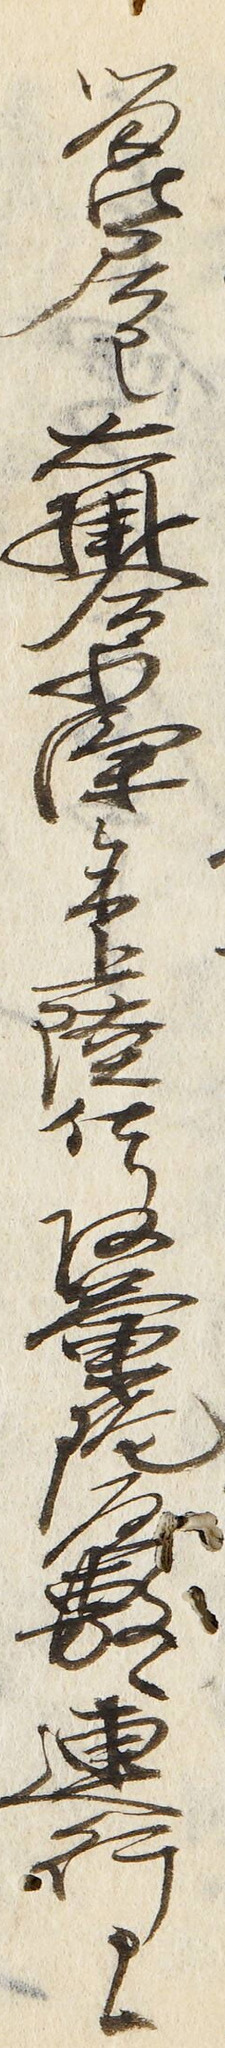留仕居申候右掛合相済候而上陸仕り阿蘭陀屋敷へ連行申候
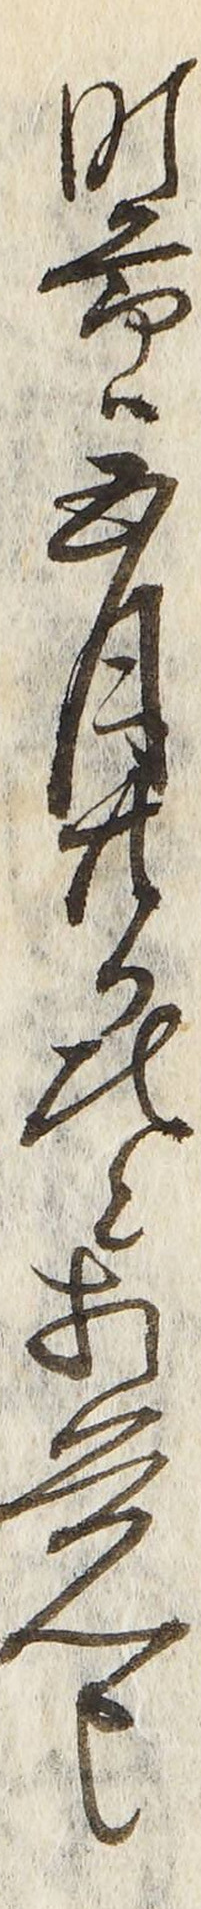時節は五月廿日頃と相覚申候
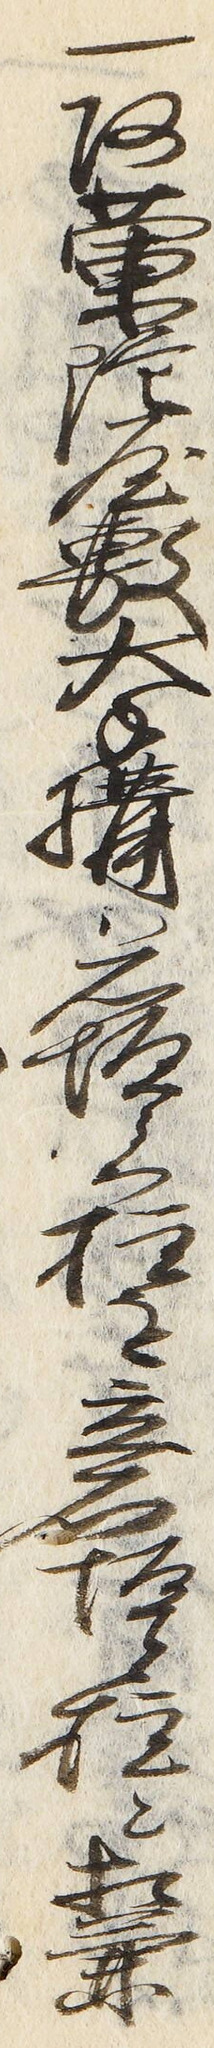一阿蘭陀屋敷大手構は石垣ニ而柱を立石垣と柱と相兼
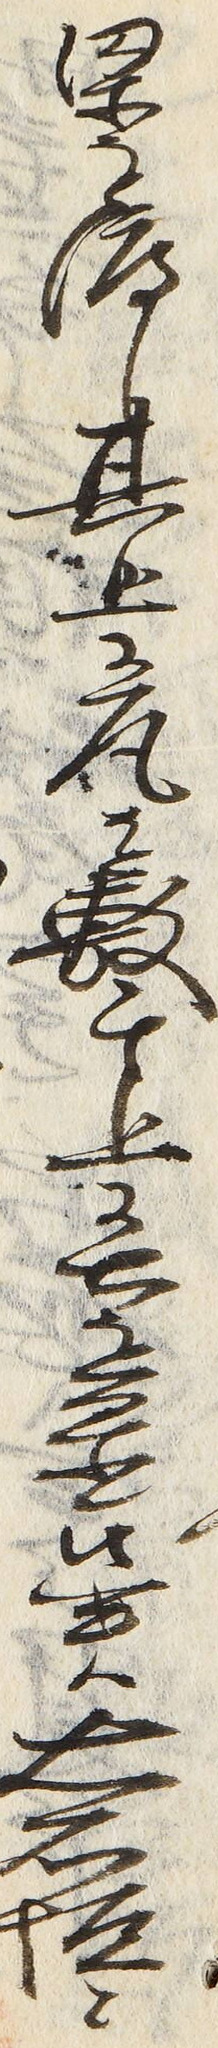梁を渡し其上ニ瓦を敷其上ニ土を置御坐候右石垣と
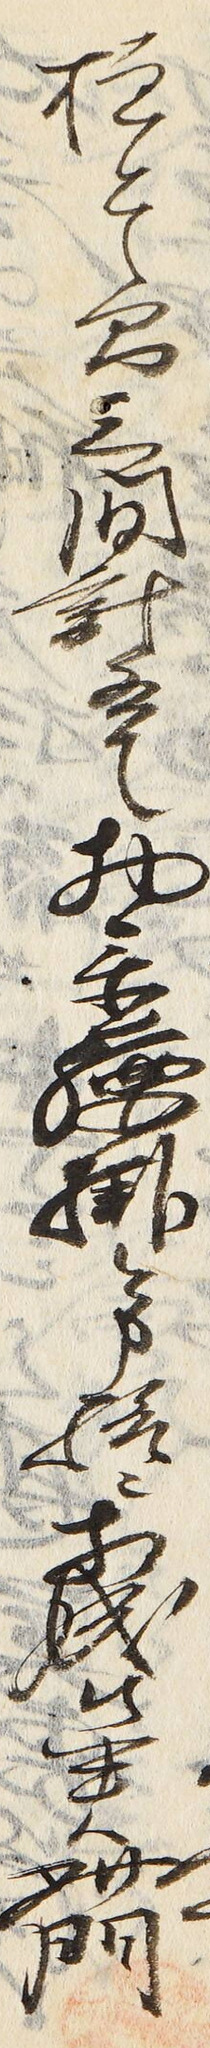柱と之間三間計有て物置腰掛と申様ニ相成御坐候此門
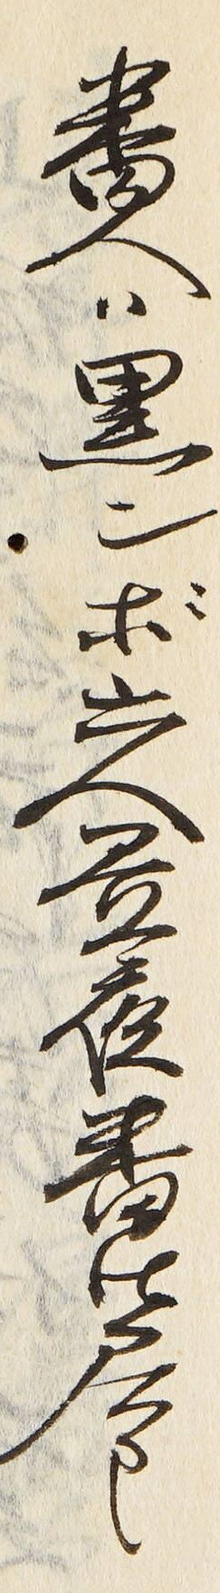番人は黒ンボ六人昼夜番仕居申候
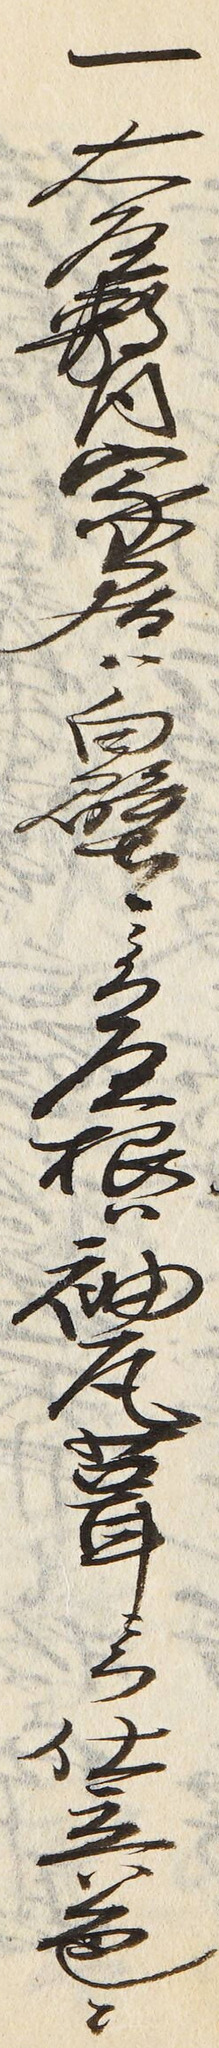一右屋敷内家居は白壁ニ而屋根は袖瓦葺ニ而仕立は色ニ
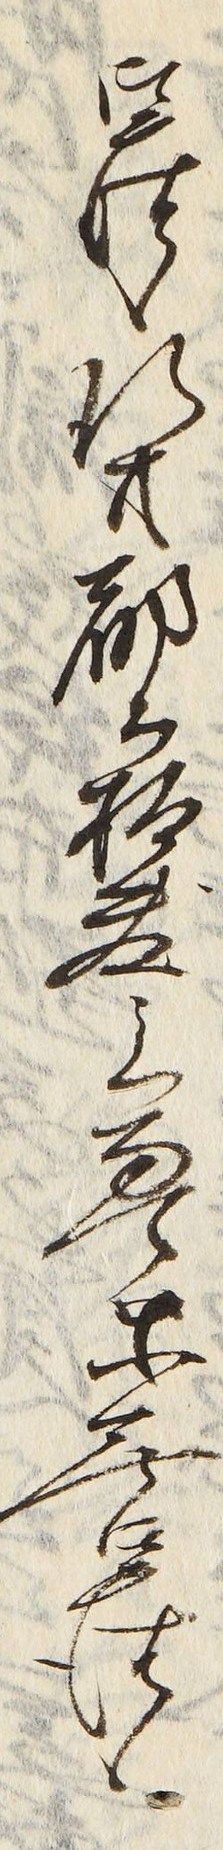御座候得共都而板敷ニ而畳等無御座候
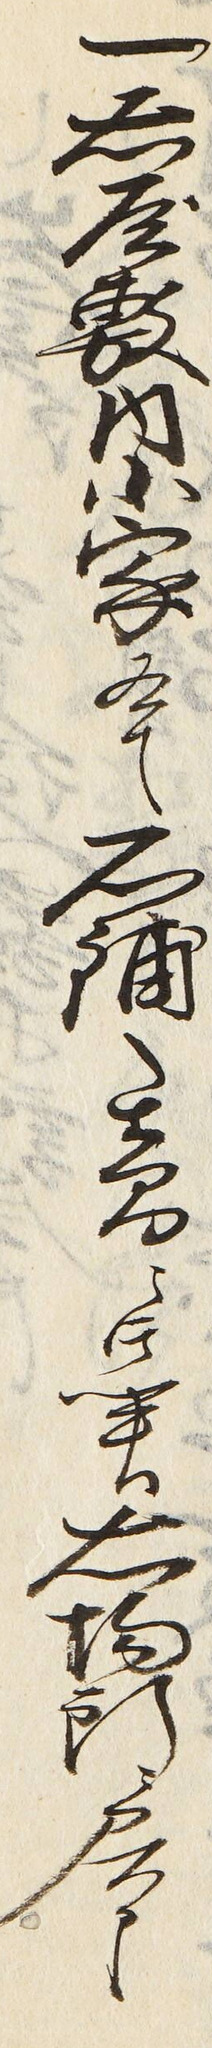一右屋敷内小家有之石舗之土間に御坐候右場所ニ居申候
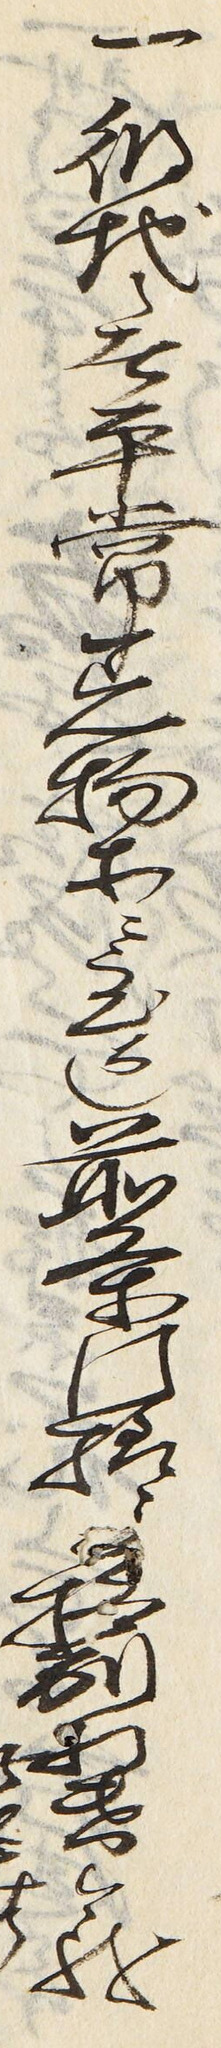一彼地之者平常着物等ニ至迄前条同様ニ格別相替義無御座候
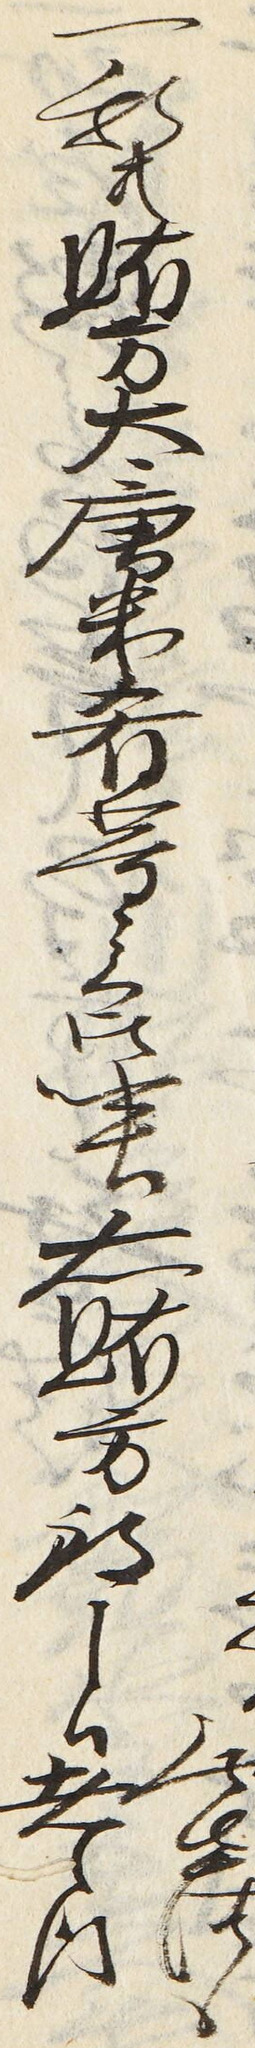一私共賄方太唐米肴等ニ而御坐候右賄方致し候者之内
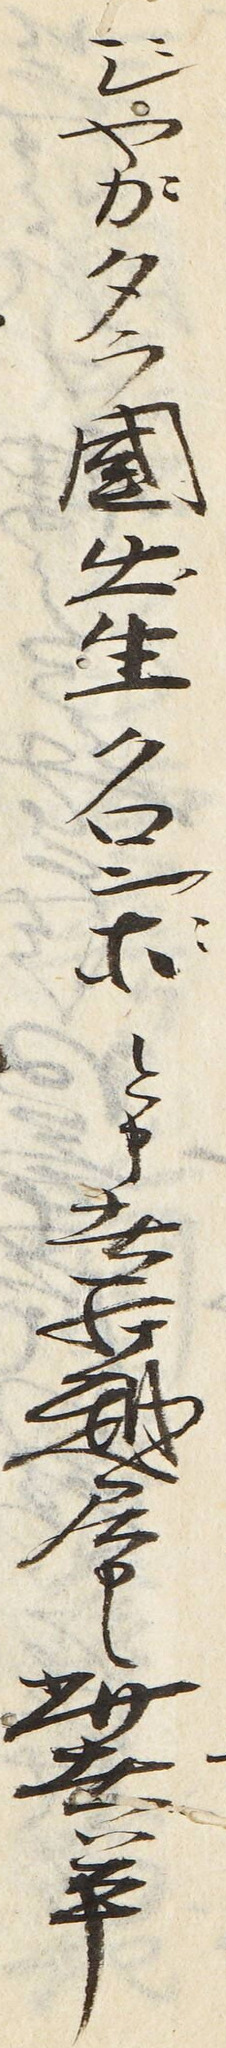ジヤガタラ国出生クロンボと申者罷越居申候此者は平
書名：漂流記
